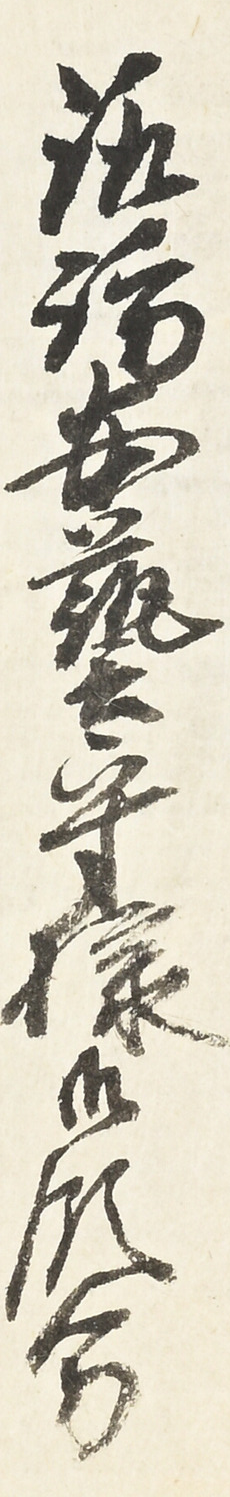諏訪安芸守様御領分
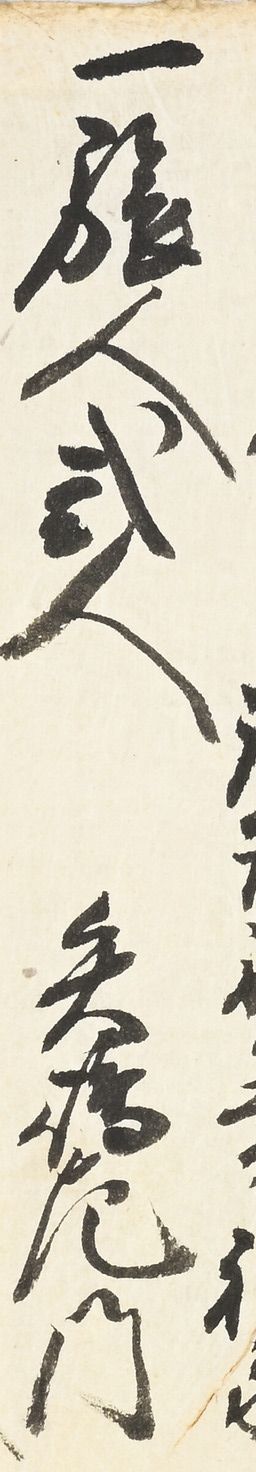一旅人弐人矢嶋左門
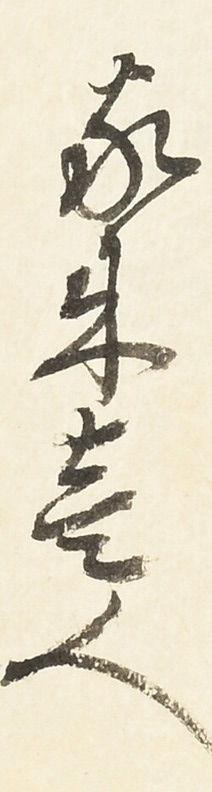家来壱人
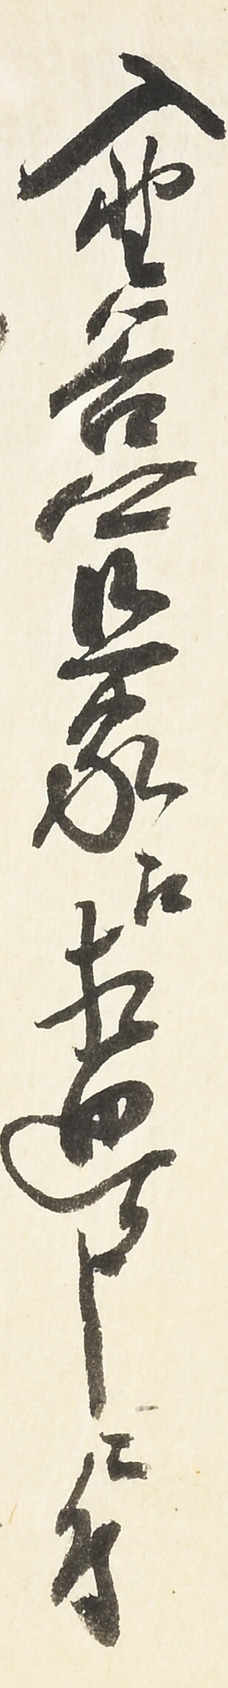入野谷郷旦家江相廻リ申ニ付
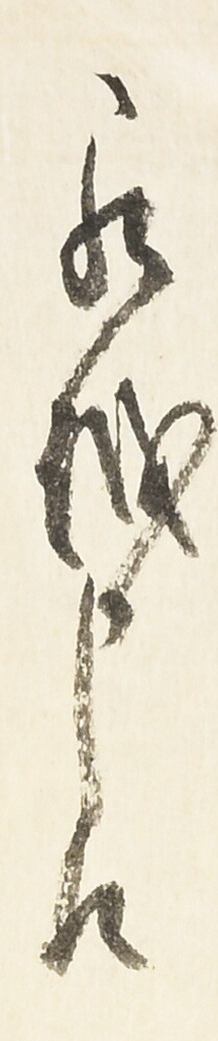罷越申候
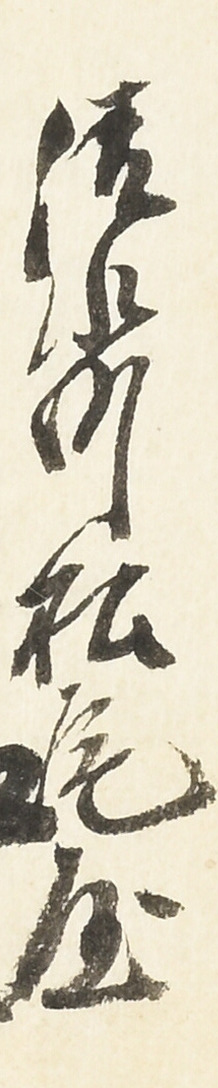清水町松尾屋
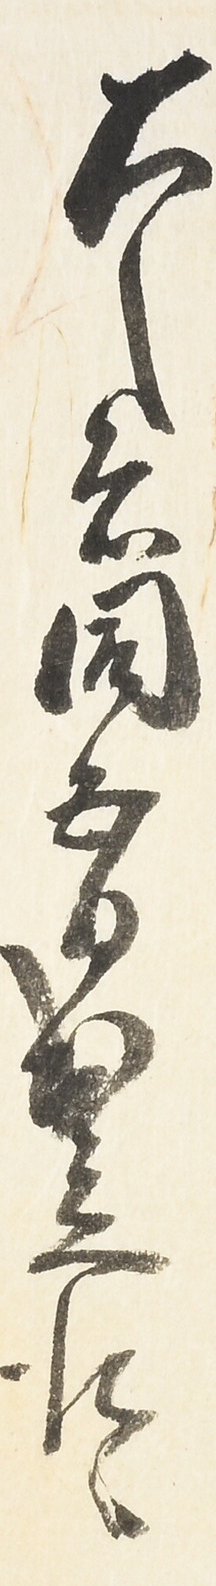右之者同五日出立仕候
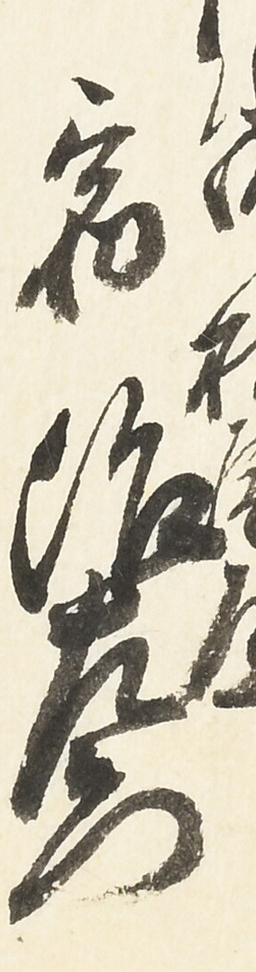宿治左衛門
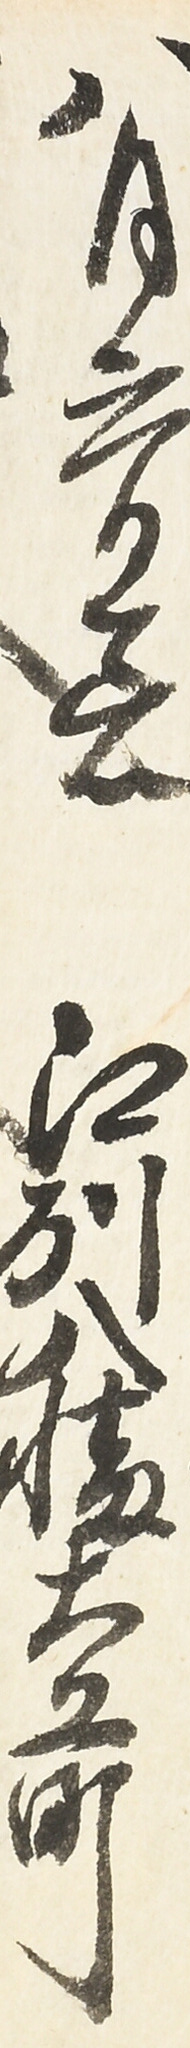八月六日着江州八幡大工町
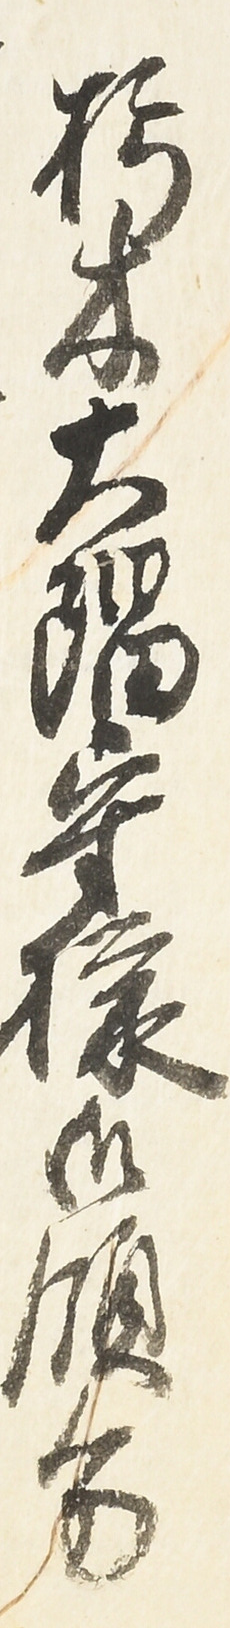朽木大隅守様御領分
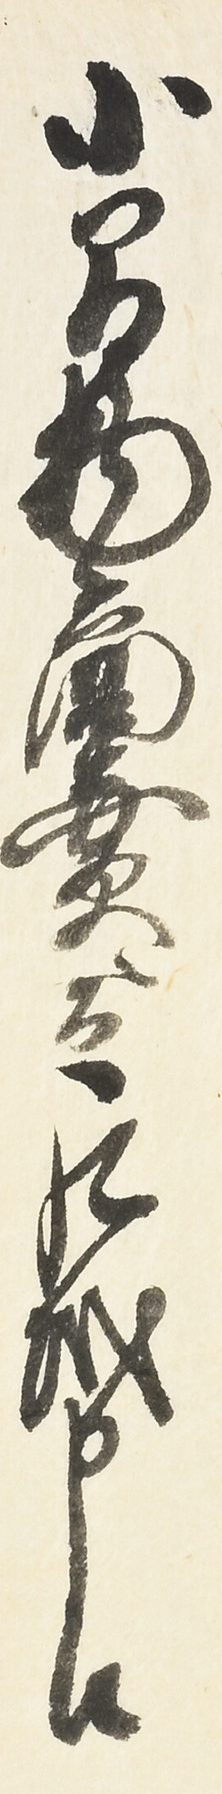小間物商売ニ而罷越申候
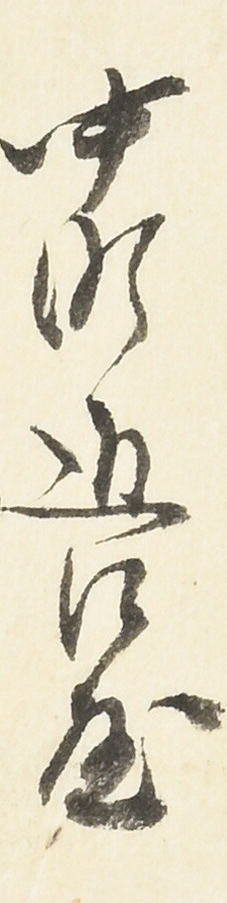中町近江屋
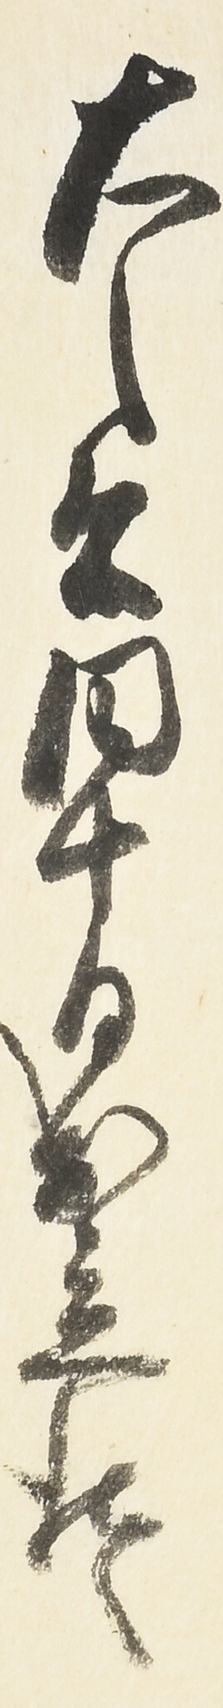右之者同十日出立仕候
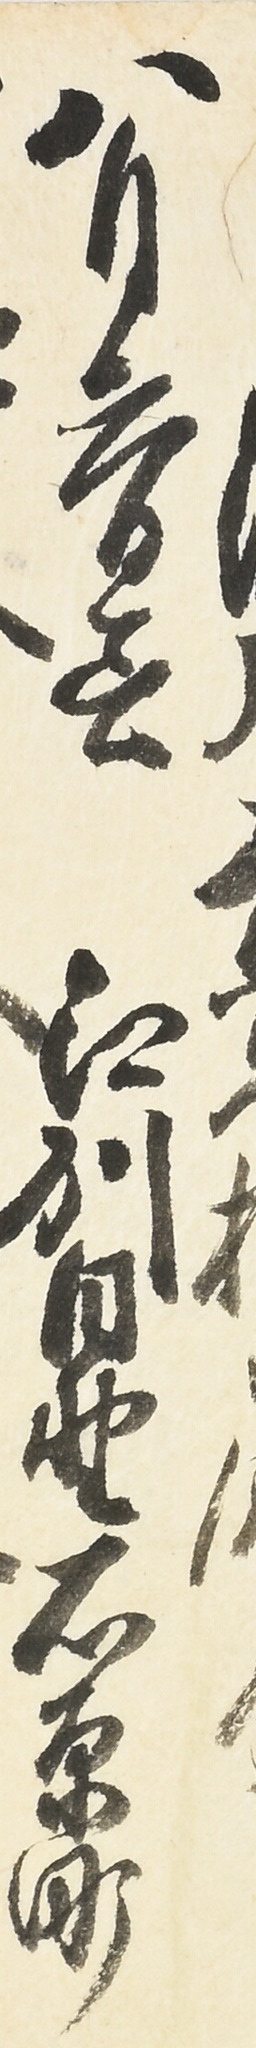八月六日着江州日野石原町
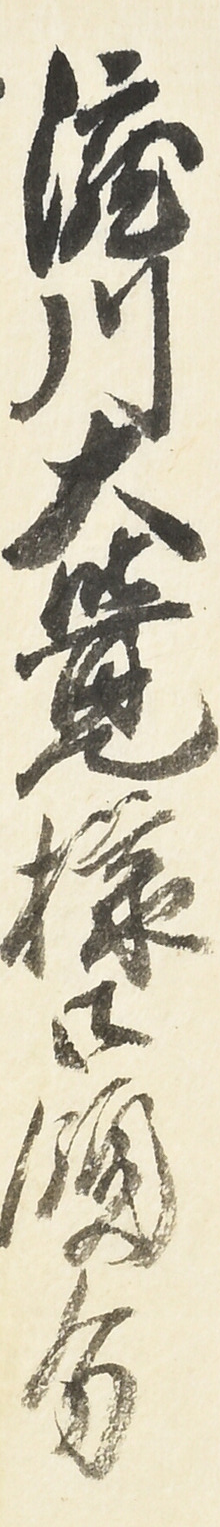瀧川大覚様御領分
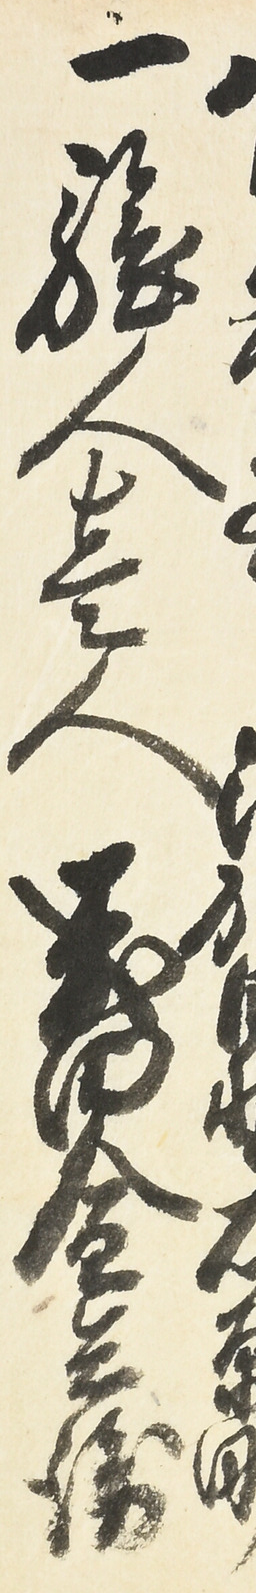一旅人壱人森田金兵衛
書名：町中旅人泊控帳
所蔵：伊那市立高遠町図書館・合同会社AMANE
